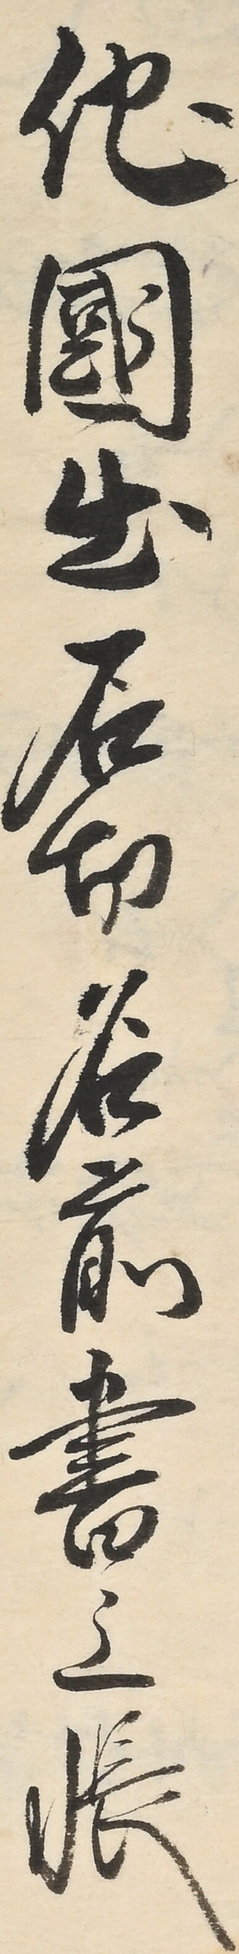他国出石切名前書上帳
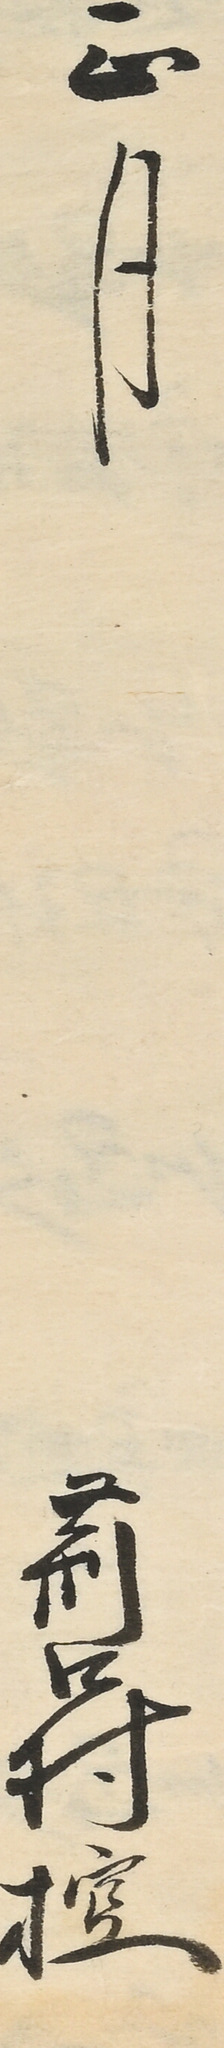正月荊口村控

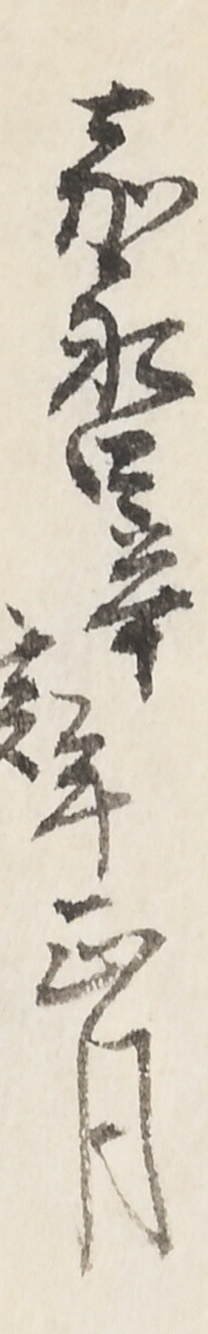嘉永四辛亥年正月
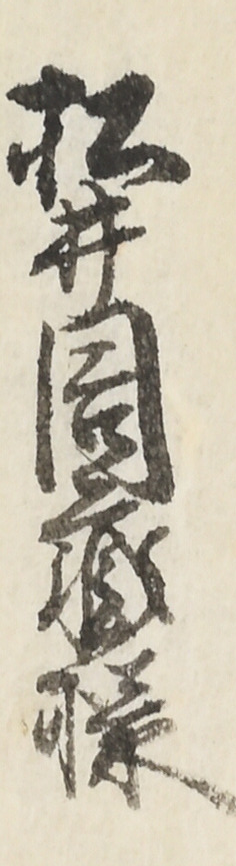松井周蔵様
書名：嘉永四辛亥年正月他國出石切名前書上帳
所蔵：伊那市立高遠町図書館・合同会社AMANE
